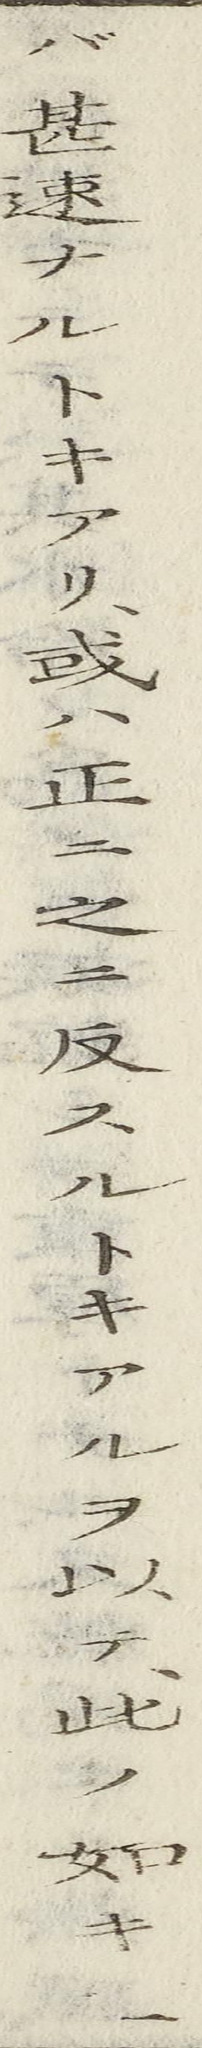バ其甚速ナルトキアリ、或ハ正ニ之ニ反スルトキアルヲ以テ、此ノ如キ一
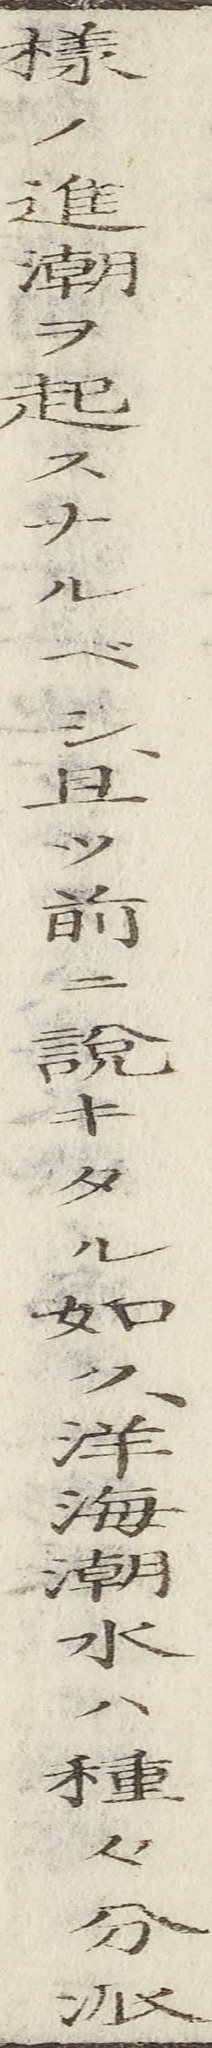様ノ進潮ヲ起スナルベシ、且ツ前ニ説キタル如ク、洋海潮水ハ種々分派
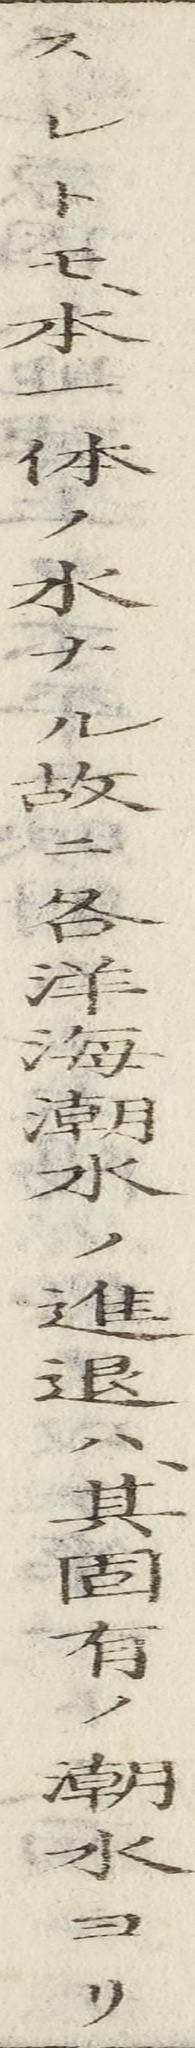スレトモ、本一体ノ水ナル故ニ各洋海潮水ノ進退ハ、其固有ノ潮水ヨリ
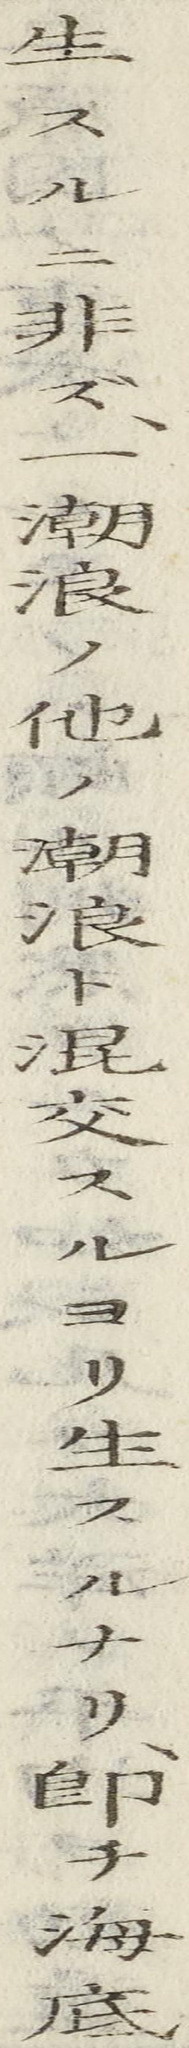生スルニ非ズ、一潮浪ノ他ノ潮浪ト混交スルヨリ生スルナリ、即チ海底
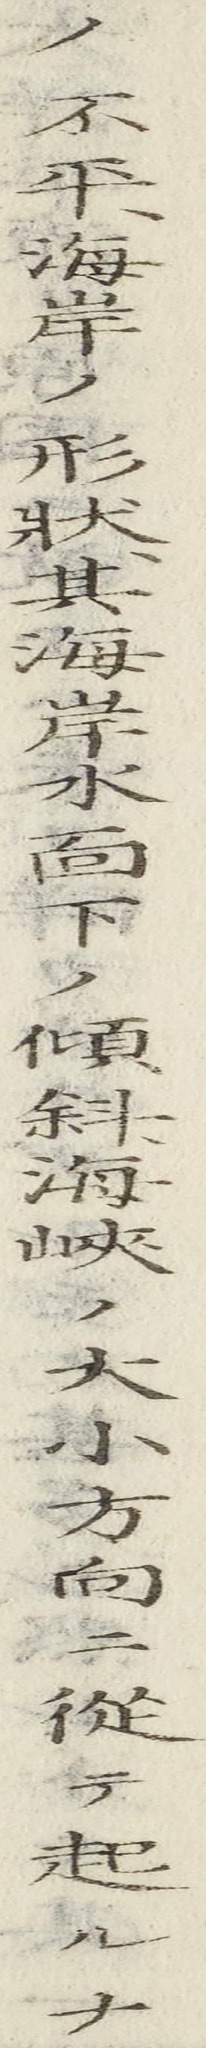ノ不平、海岸ノ形状、其海岸水面下ノ傾斜、海峡ノ大小方向ニ従テ起ルナ
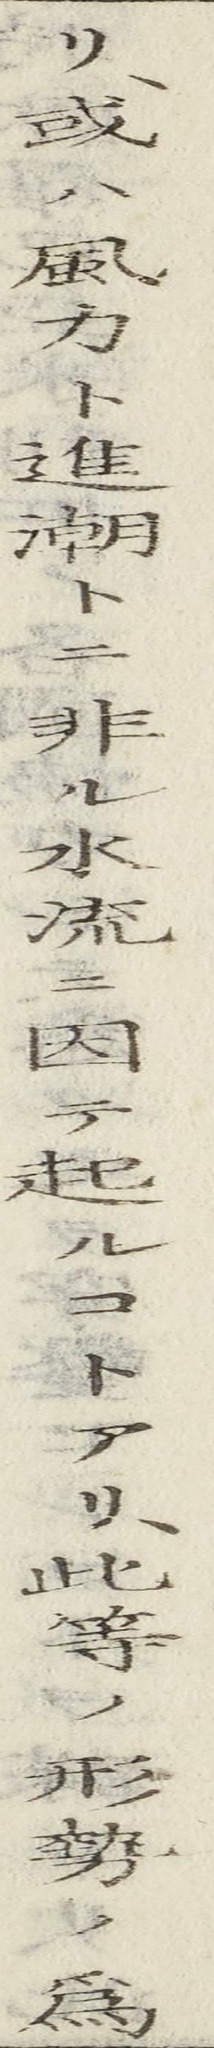リ、或ハ風力ト進潮トニ非ル水流ニ因テ起ルコトアリ、此等ノ形勢ノ為
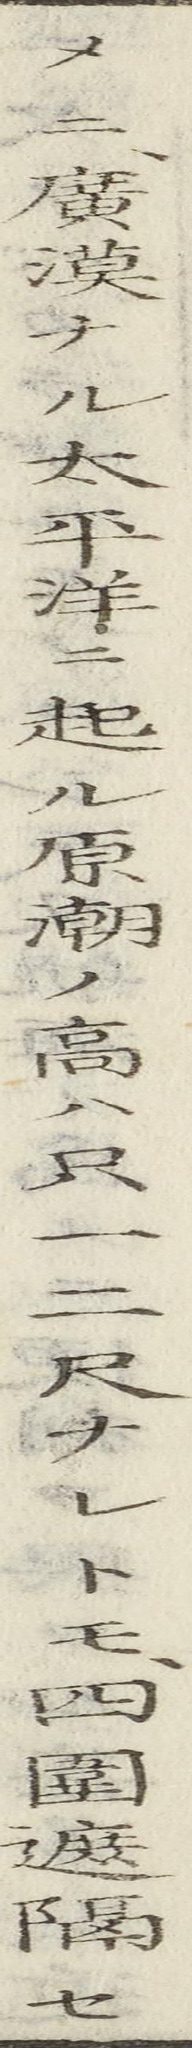メニ、広漠ナル太平洋ニ起ル原潮ノ高ハ只一ニ尺ナレトモ、四囲遮隔セ
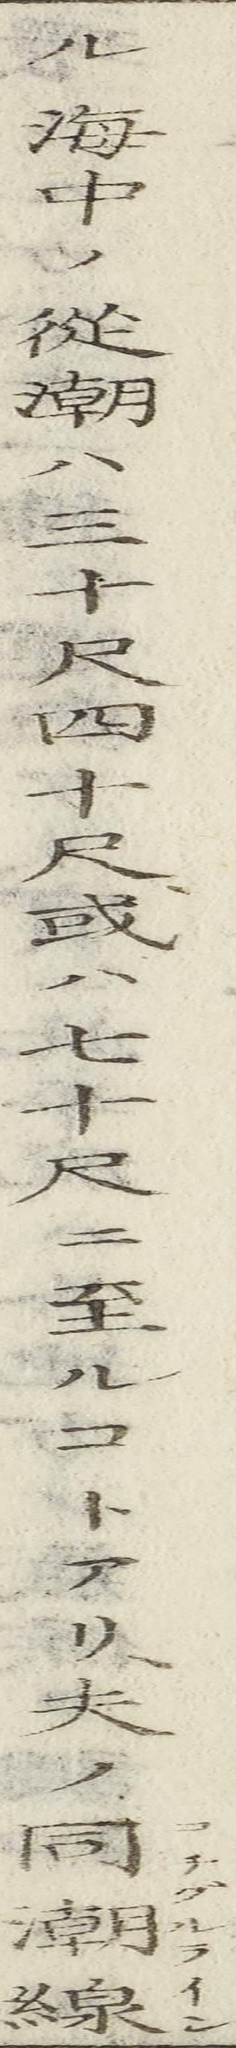ル海中ノ従潮ハ三十尺四十尺、或ハ七十尺ニ至ルコトアリ、夫ノ同潮線
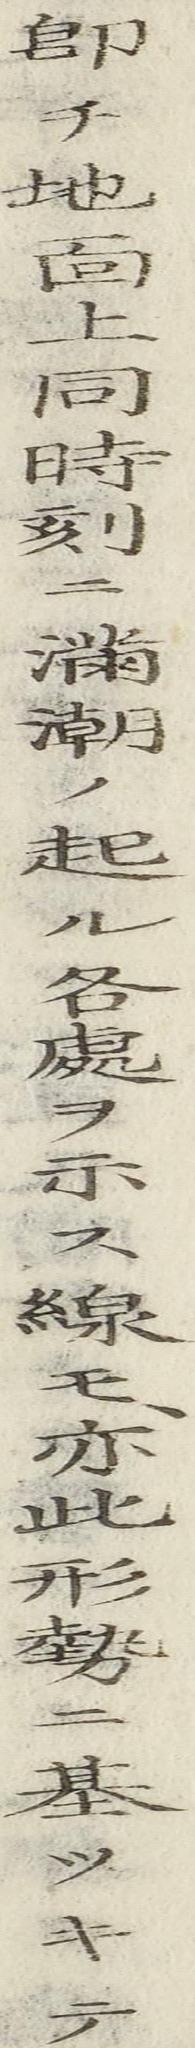即チ地面上同時刻ニ満潮ノ起ル各処ヲ示ス線モ、亦此形勢ニ基ツキテ
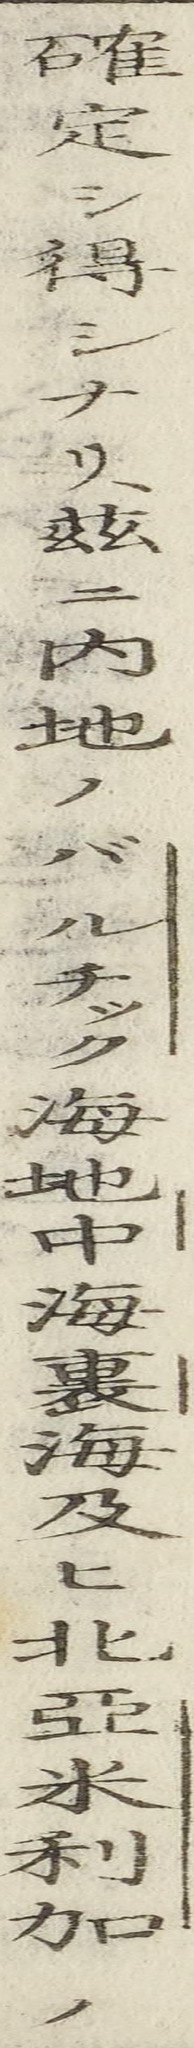確定シ得シナリ、茲ニ内地ノバルチック海地中海裏海及ヒ北亜米利加ノ

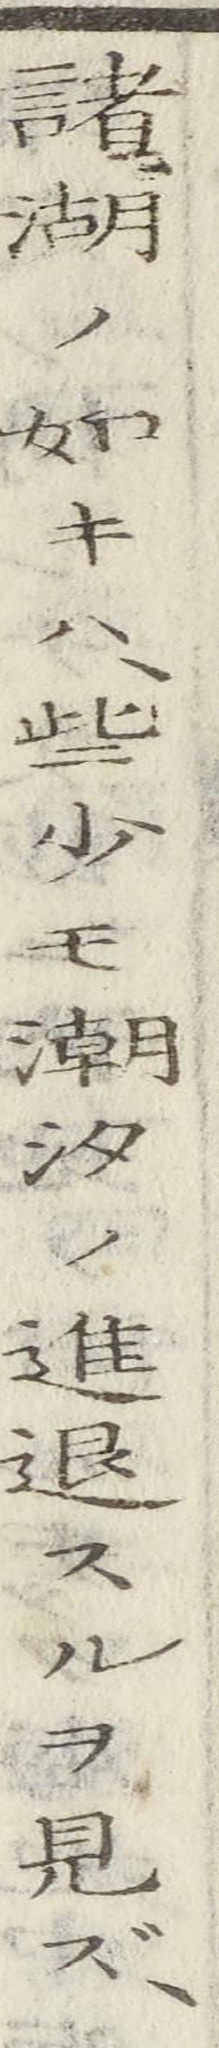緒湖ノ如キハ、些少モ潮汐ノ進退スルヲ見ズ、
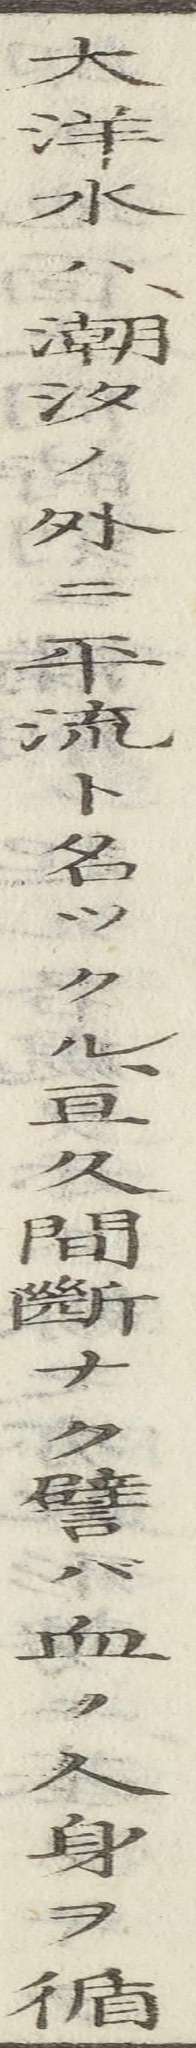大洋水ハ、潮汐ノ外ニ平流ト名ツクル、亘久間断ナク譬バ血ノ人身ヲ循
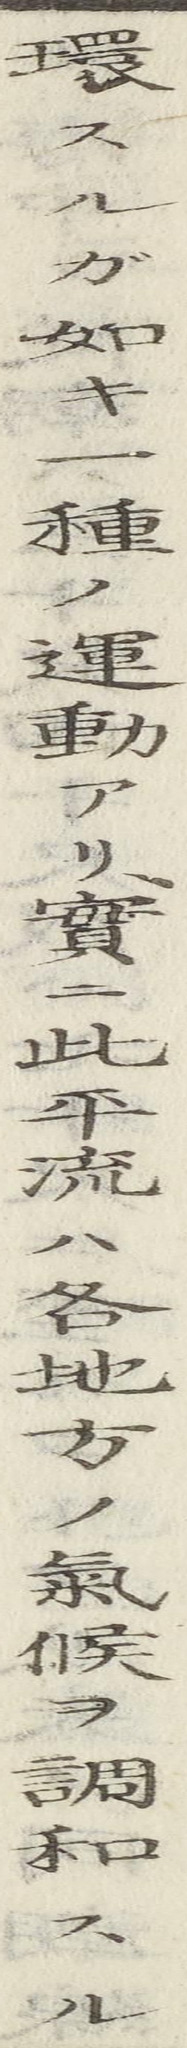環スルガ如キ一種ノ運動アリ、実ニ此平流ハ各地方ノ気候ヲ調和スル
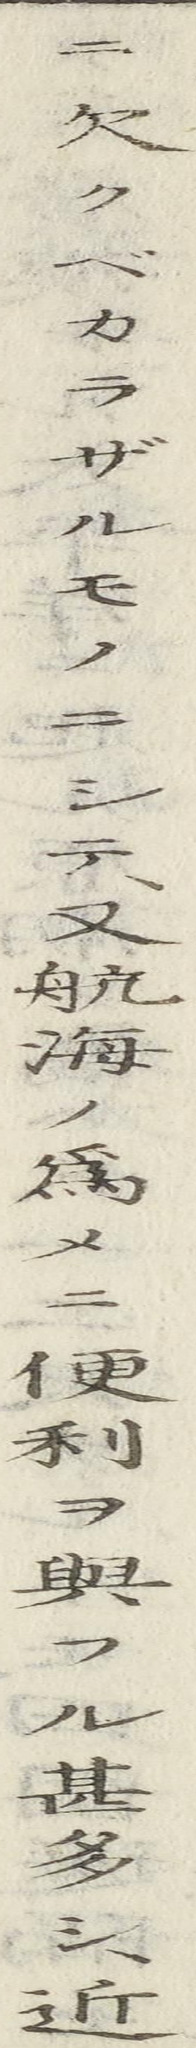ニ欠クベカラザルモノニシテ、又航海ノ為メニ便利ヲ与フル甚多シ、近
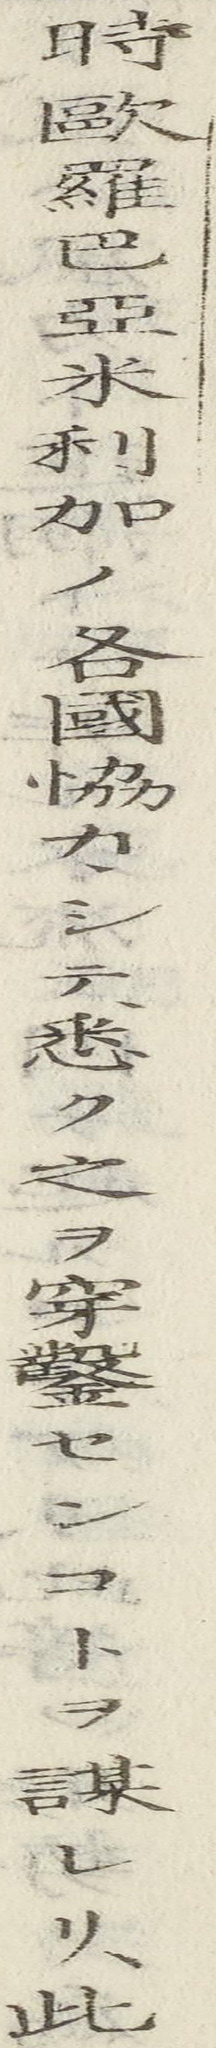時欧羅巴亜米利加ノ各国協力シテ、悉ク之ヲ穿鑿センコトヲ謀レリ、此
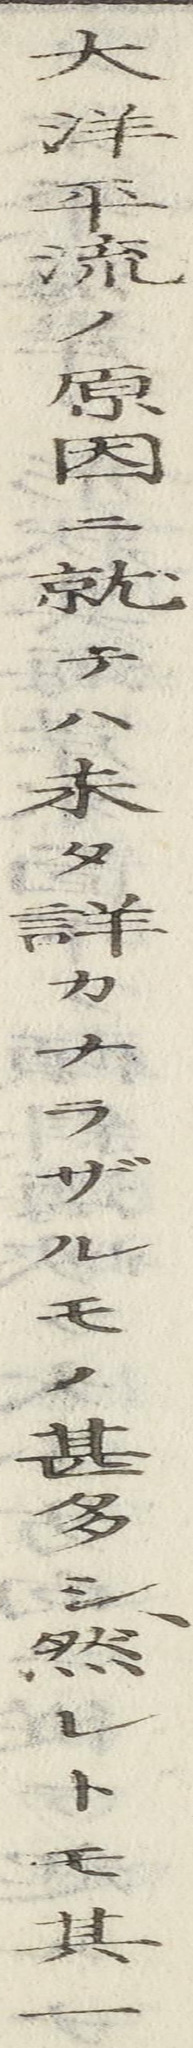大洋平流ノ原因ニ就テハ未タ詳カナラザルモノ甚多シ、然レトモ其一
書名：百科全書　地文學　全
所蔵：東京大学地震研究所図書室 Earthquake Research Institute Library, The University of Tokyo, JAPAN
